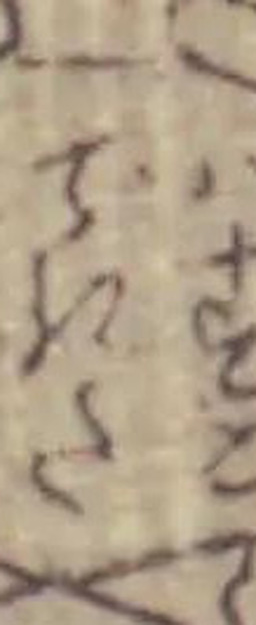できた
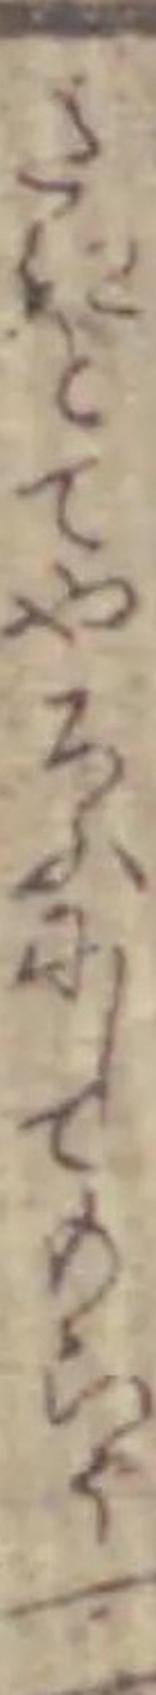たきとてやろふにしてもらう
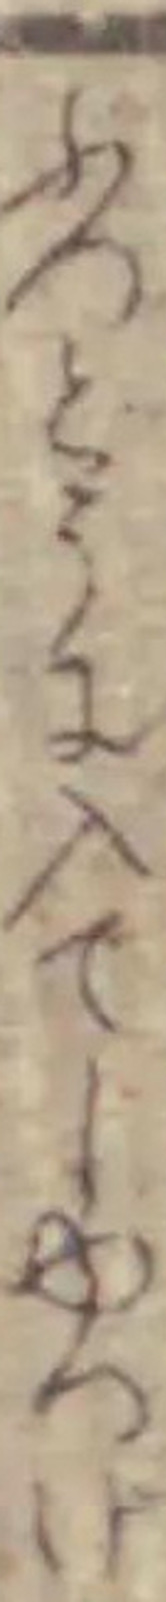ふつとうに入てしゆつけし
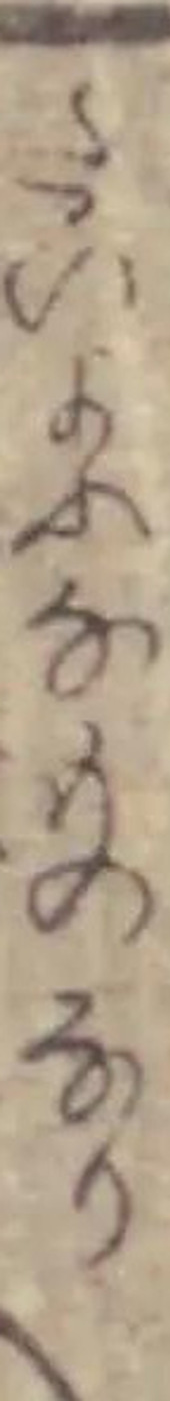たいよふなものなり
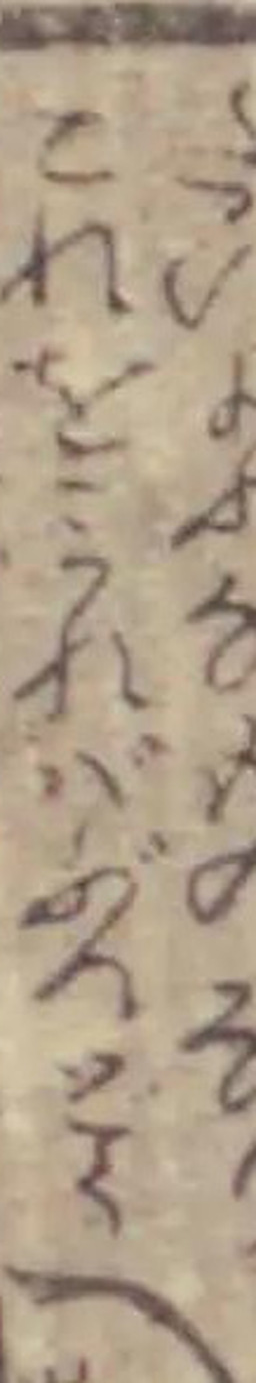これをみればぶつどう
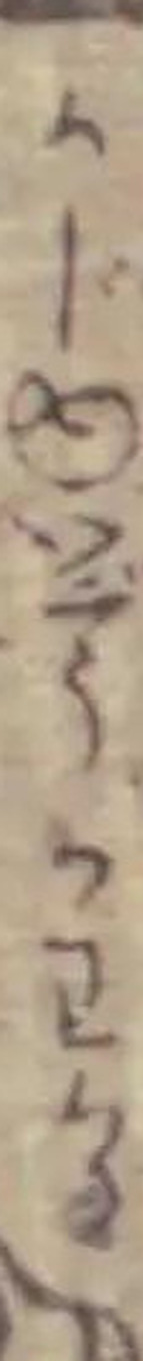かじゆどうかわから
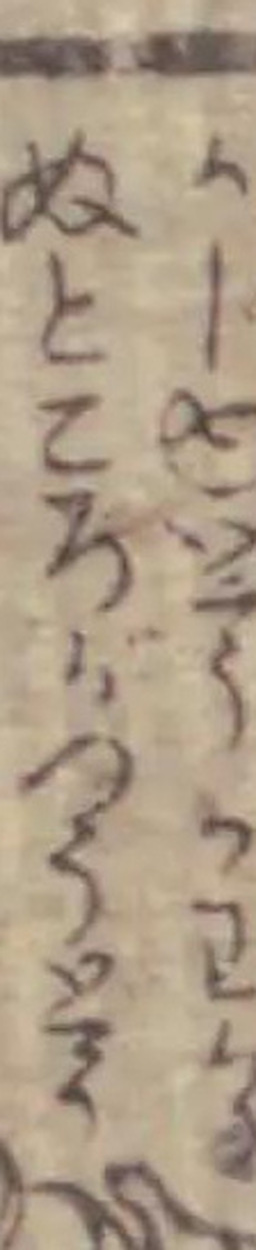ぬところがつうとう
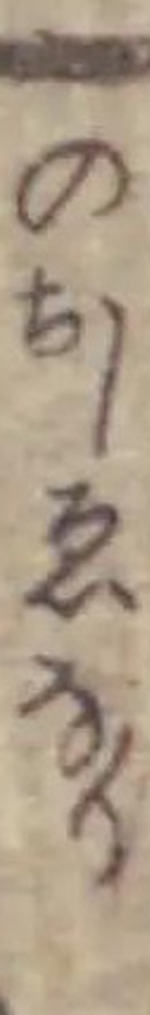のおしゑなり
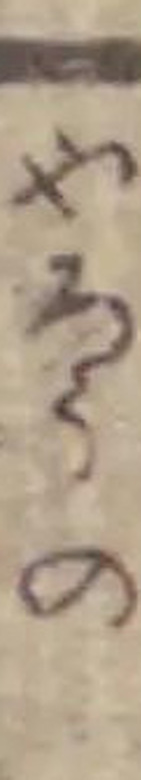やろうの
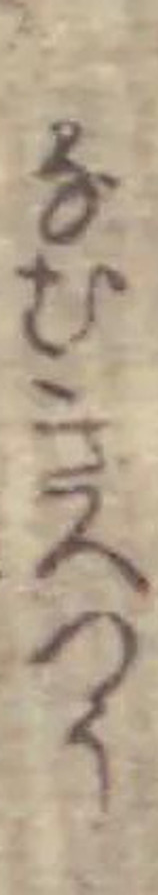なむきへつう
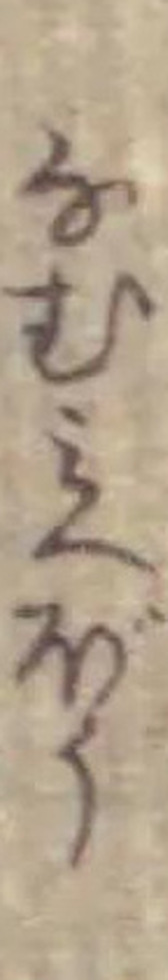なむみへぼう
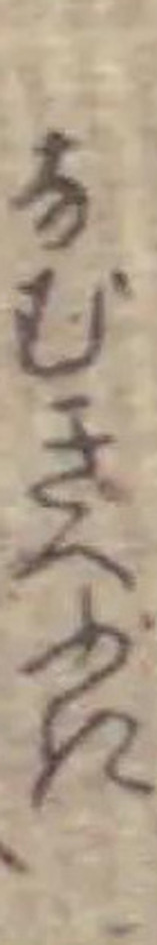なむきへぶき
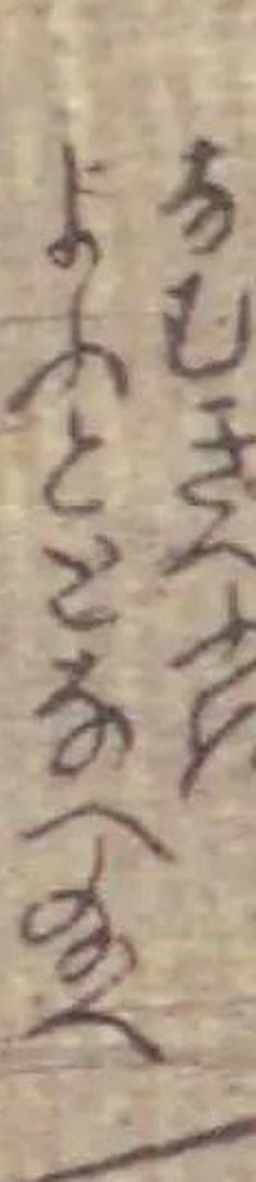よふととなへ給へ
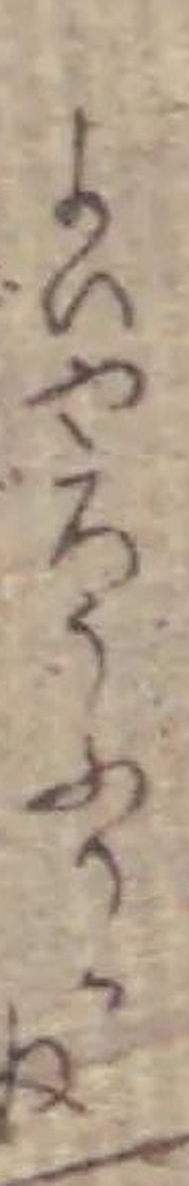よいやろうふりかね
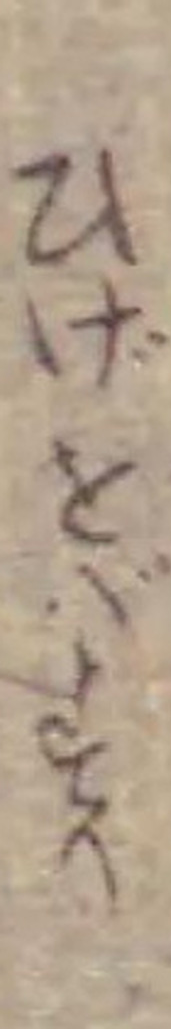ひげをばすり
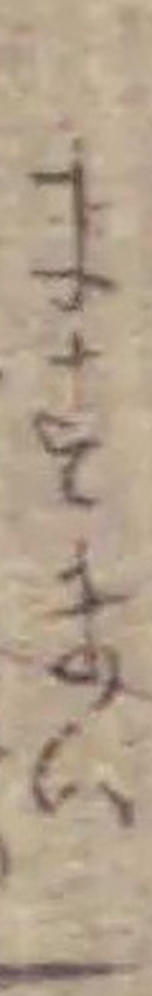ますまい
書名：茶羅毛通人 3巻
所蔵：国立国会図書館 National Diet Library, JAPAN
